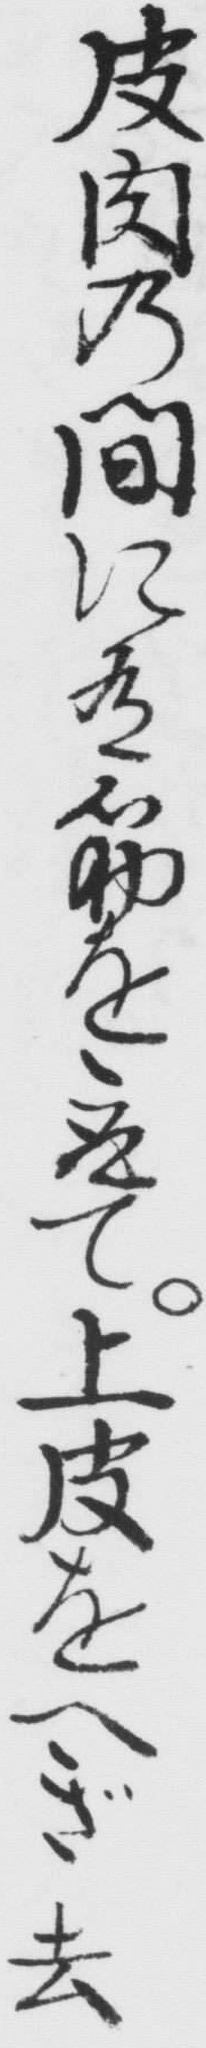筋荒皮皮肉の間に有筋を取て。上皮をへぎ去
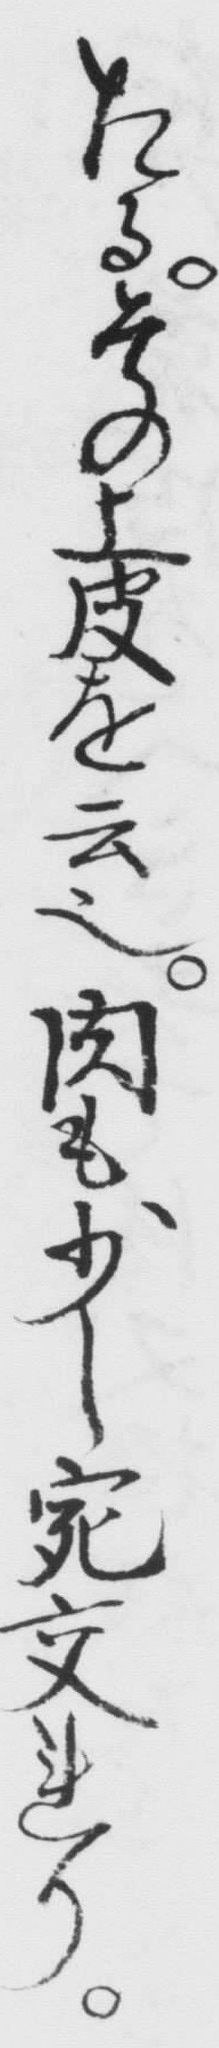たる。その上皮を云也。肉も少し宛交れり。
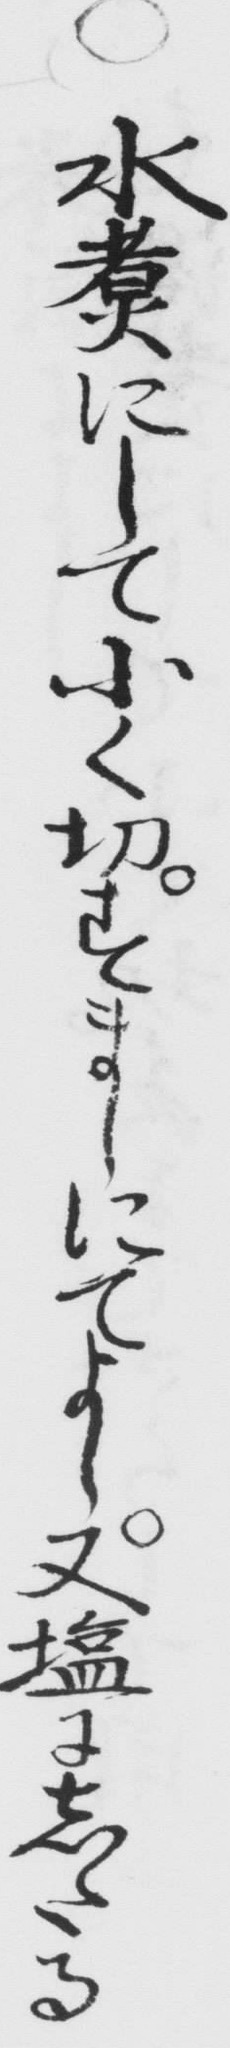○水煮にして小く切。すましにてよし。又塩にしたる

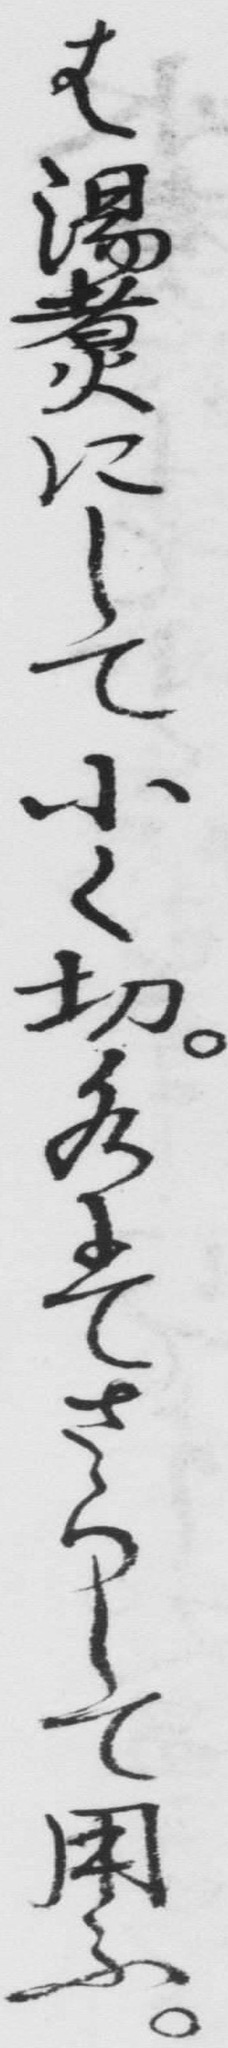は湯煮にして小く切。水にてさらして用ふ。
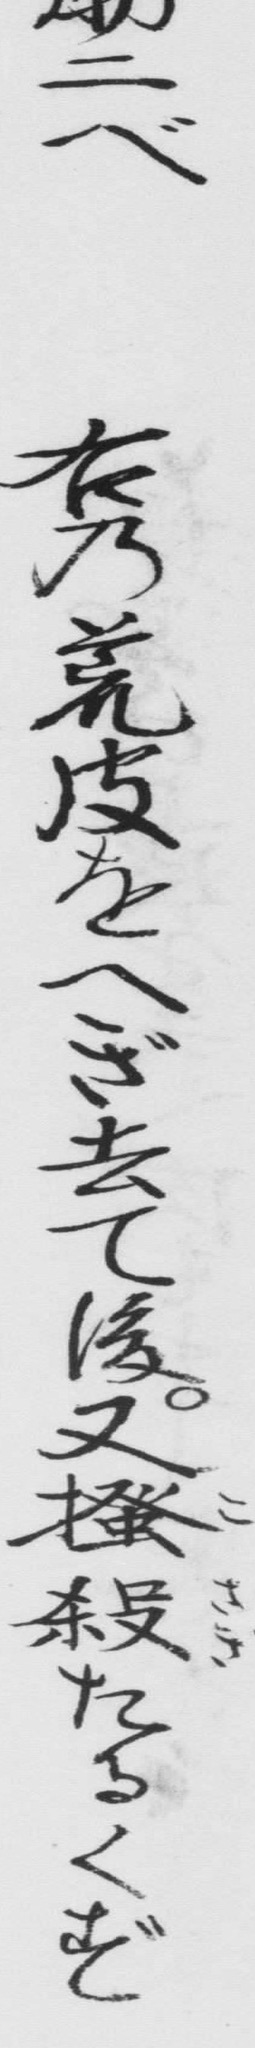筋ニベ右の荒皮をへぎ去て後。又掻殺たるくず
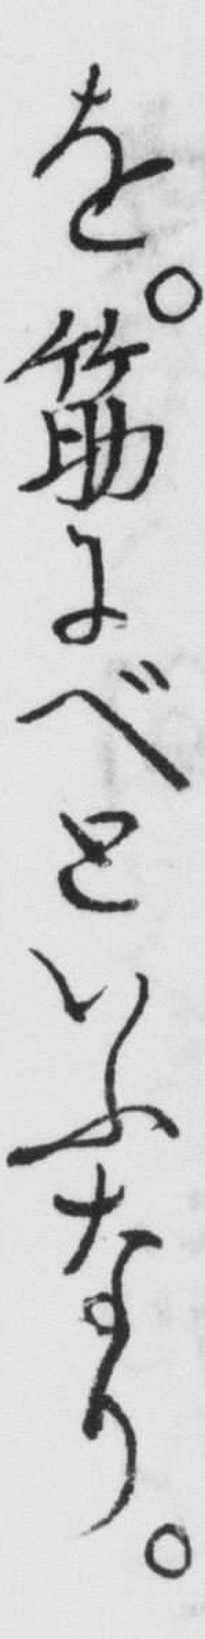を。筋にべといふなり。
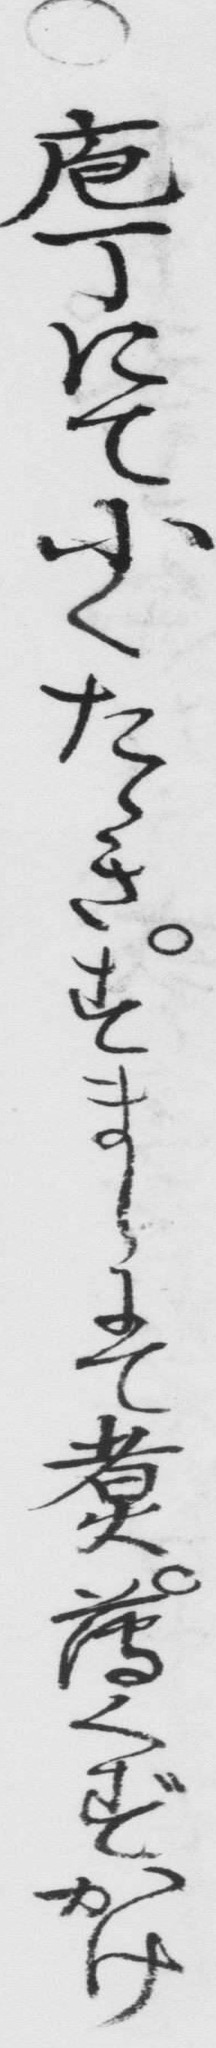○包丁にて小くたたき。すましにて煮。薄くずかけ
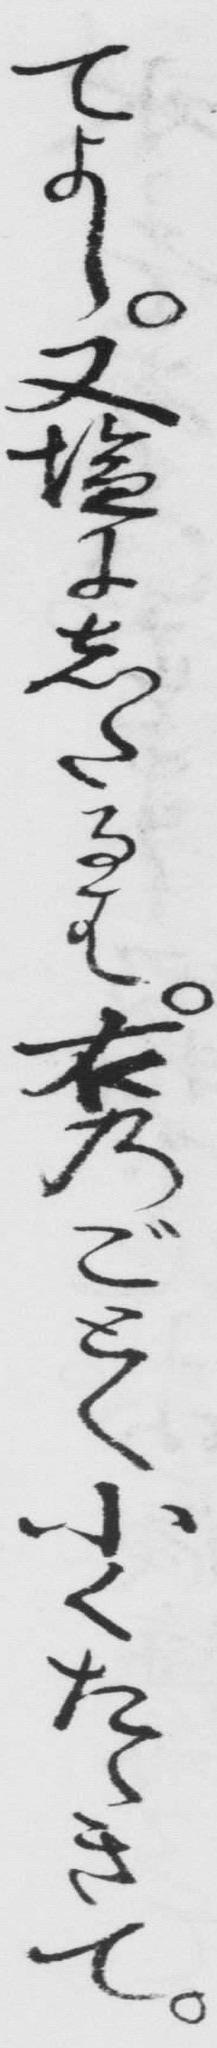てよし。又塩にしたるは。右のごとく小くたゝきて。
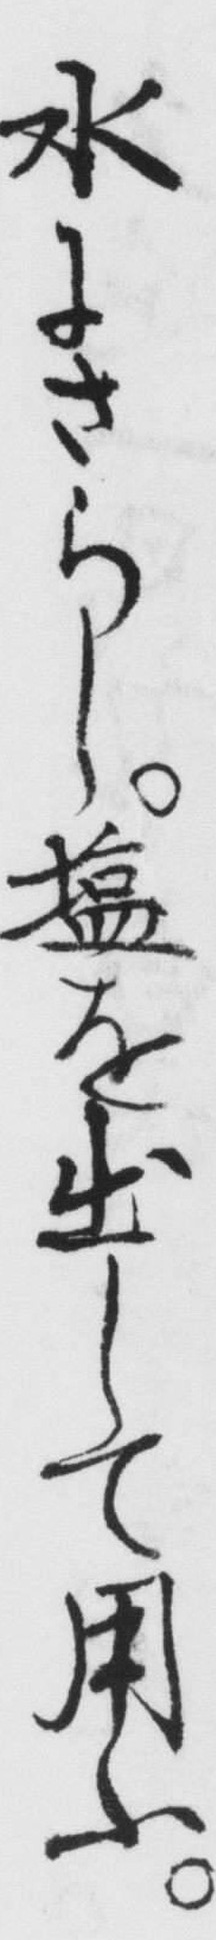水にさらし。塩を出して用ふ。
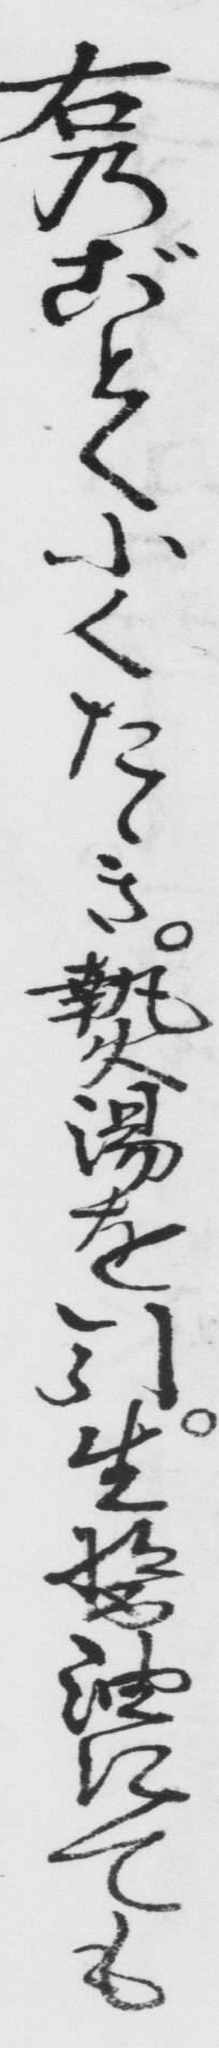○右のごとく小くたゝき。熱湯を引。生醤油にても
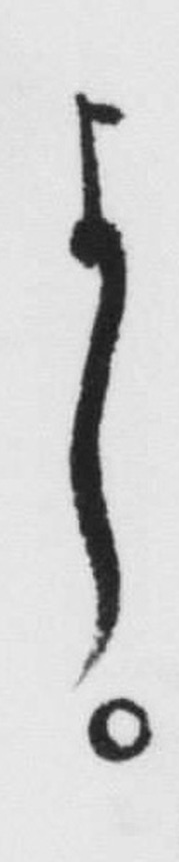よし。
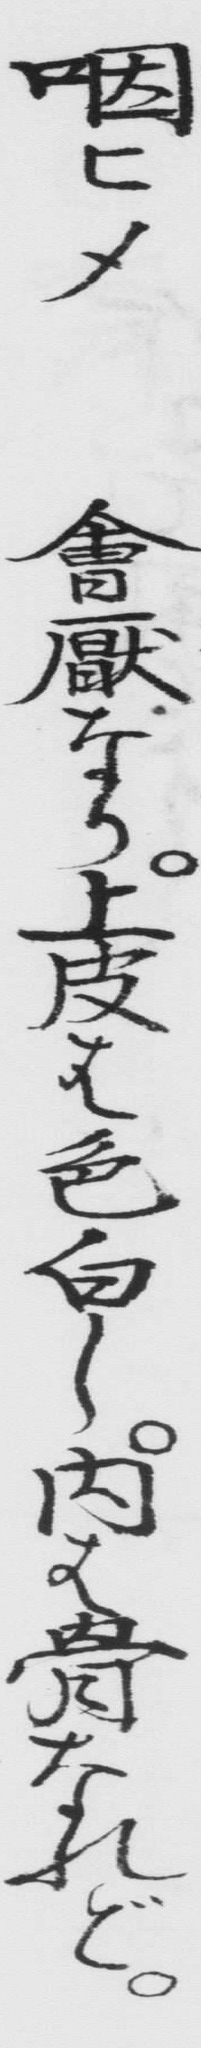咽ヒメ会厭なり。上皮は色白し。内は骨なれど。
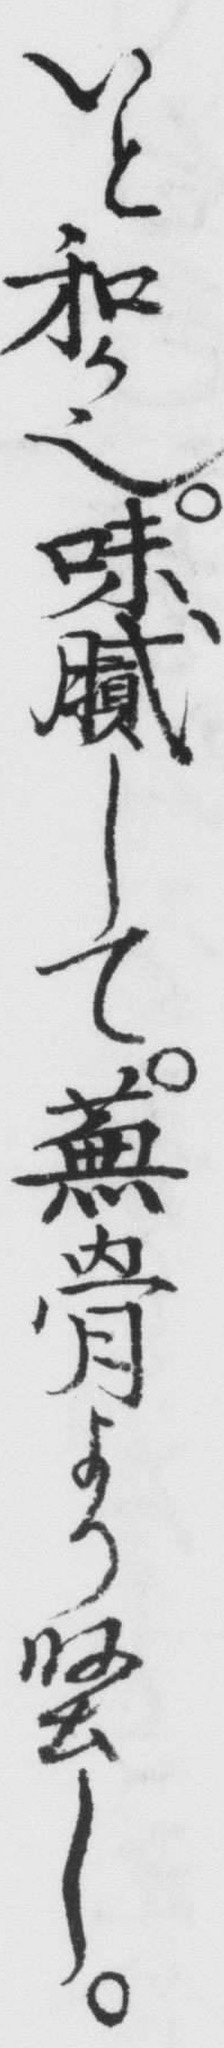いと和か也。味膩して。蕪骨より堅し。
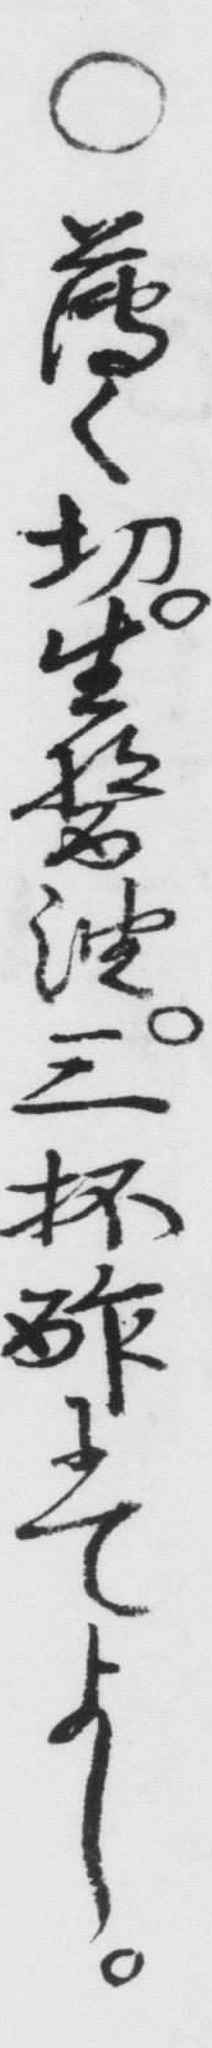○薄く切。生醤油。三杯酢にてよし。
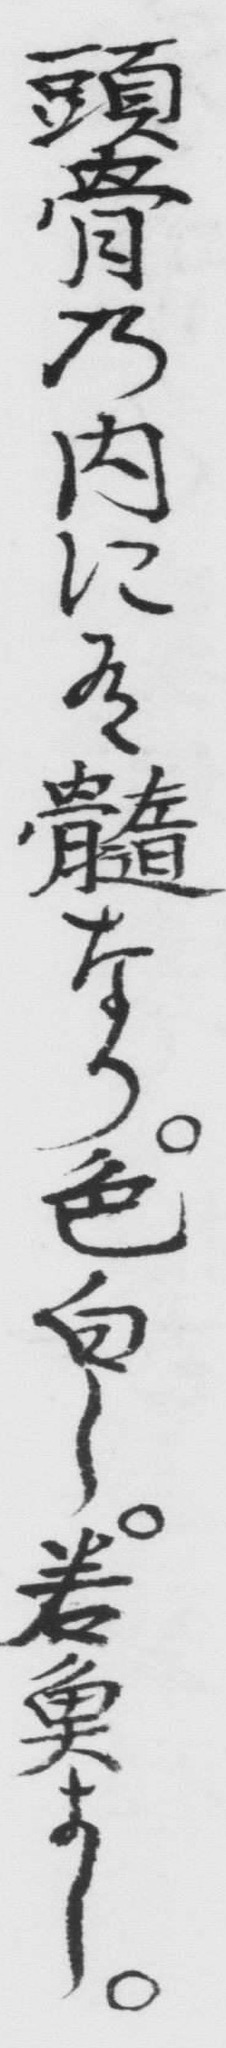蕪骨頭骨の内に有髄なり。色白し。若魚よし。
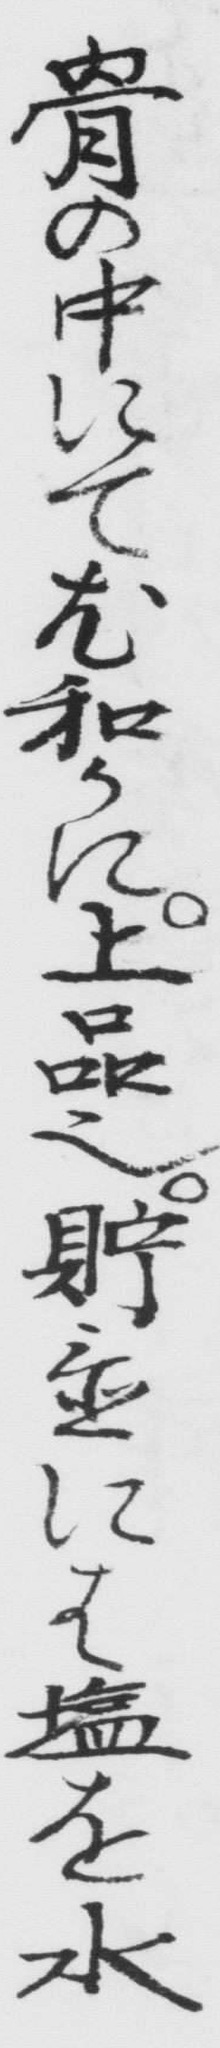骨の中にて尤和かに。上品也。貯置には塩を水
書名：鯨肉調味方
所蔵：大阪府立大学学術情報センター 国文学研究資料館
